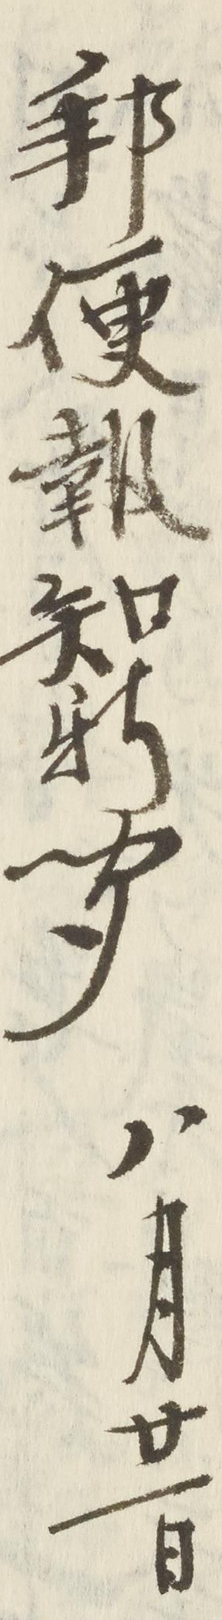郵便報知新聞八月廿一日
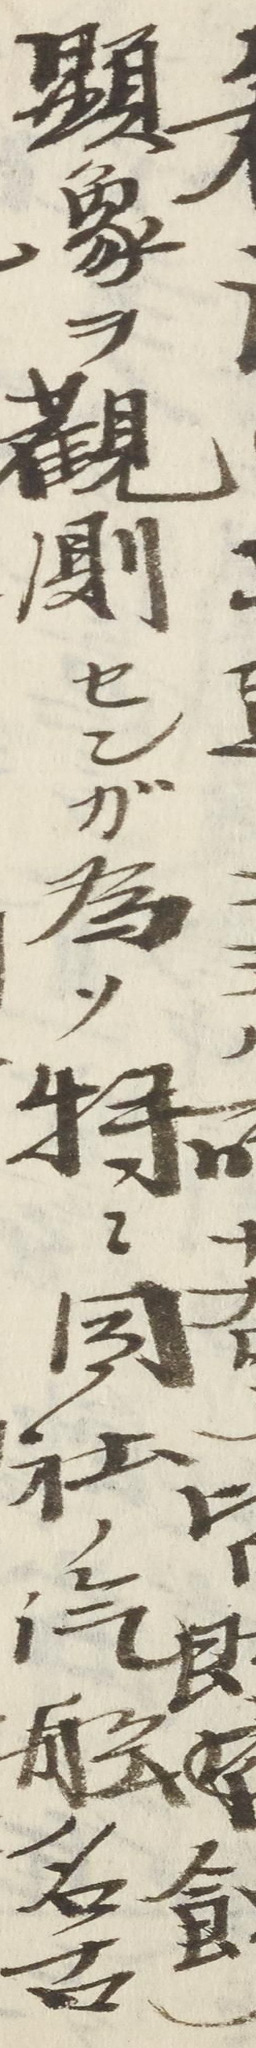顕象ヲ観測セシガ為メ特二同社ノ汽船名古
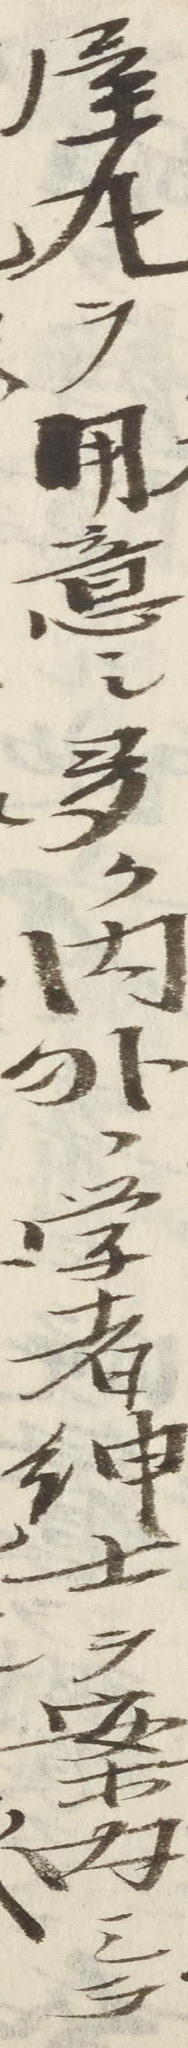屋丸ヲ用意シ多ク内外ノ学者紳士ヲ案内シテ
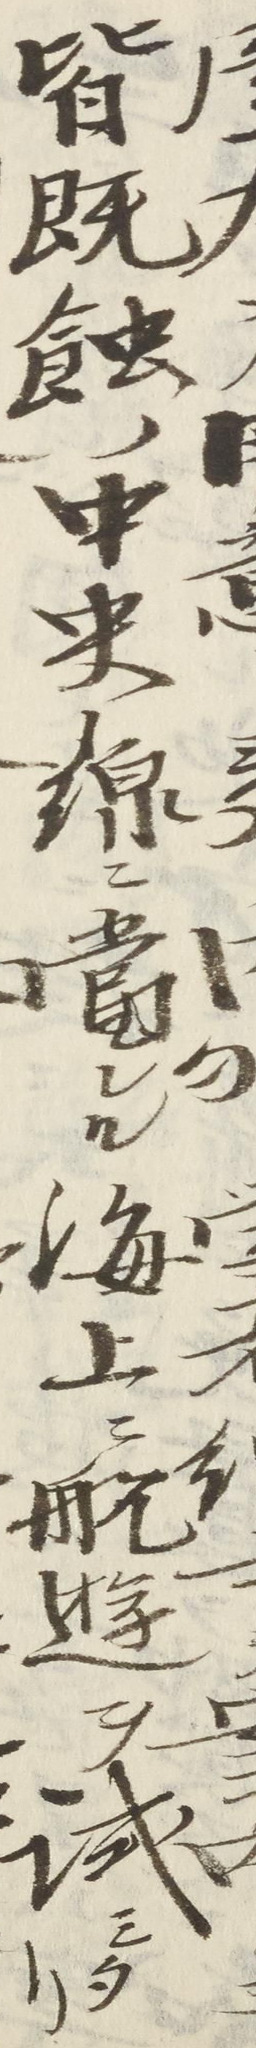皆既蝕ノ中央線二当レル海上二航遊ヲ試シタリ
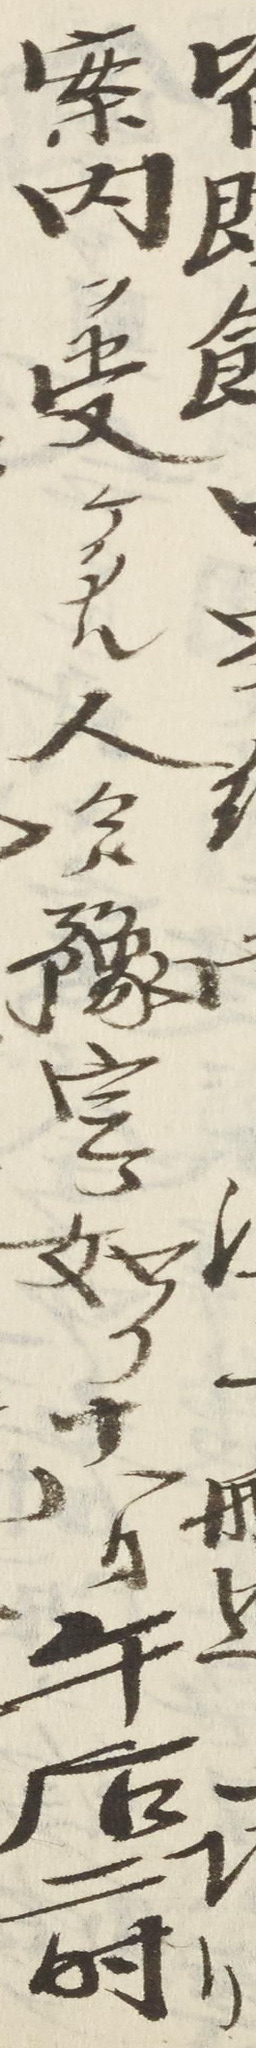案内ヲ受ケタル人々ハ予定ノ如ク十八日午後二時
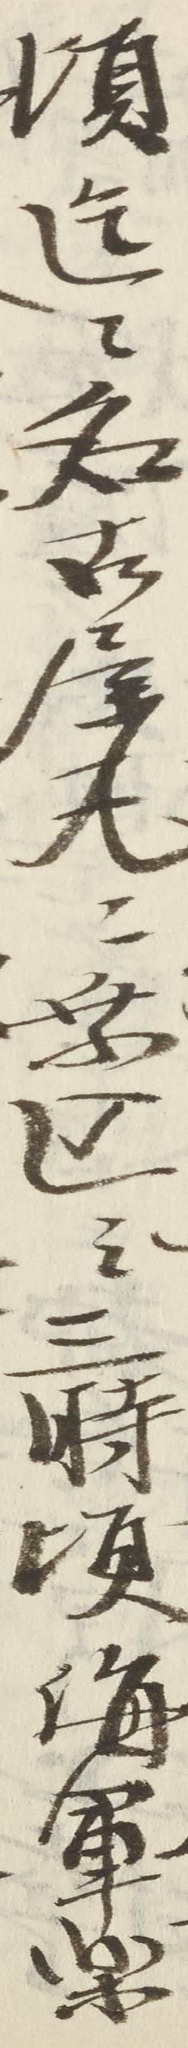頃迄二名古屋丸二乗込ミ三時頃海軍楽
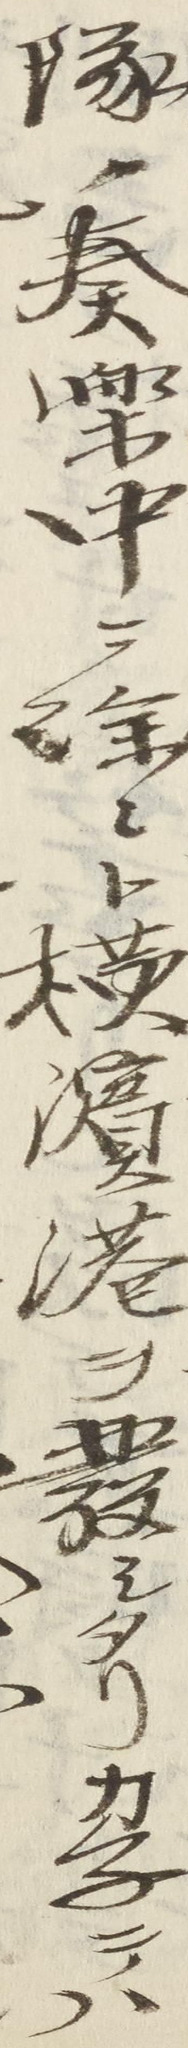隊ノ奏楽中二徐々ㇳ横浜港ヲ発シタリカ子テハ
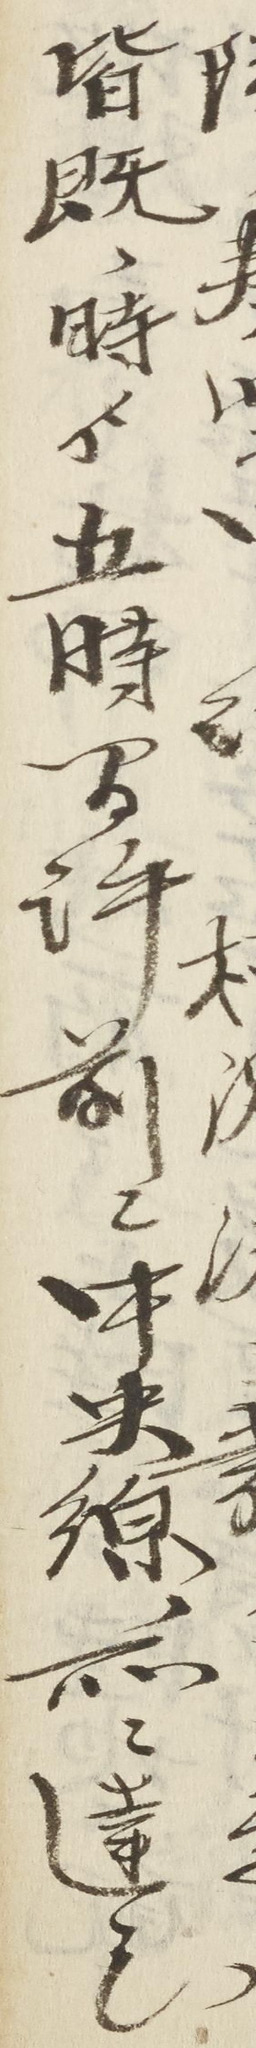皆既ノ時ゟ五時間許前二中央線ノ所二達し

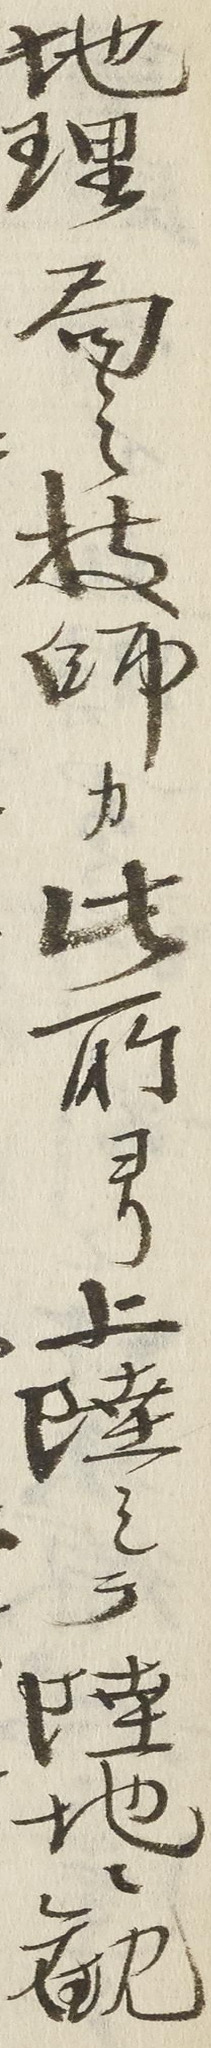地理局ノ技師カ此所ヨリ上陸シテ陸地二観
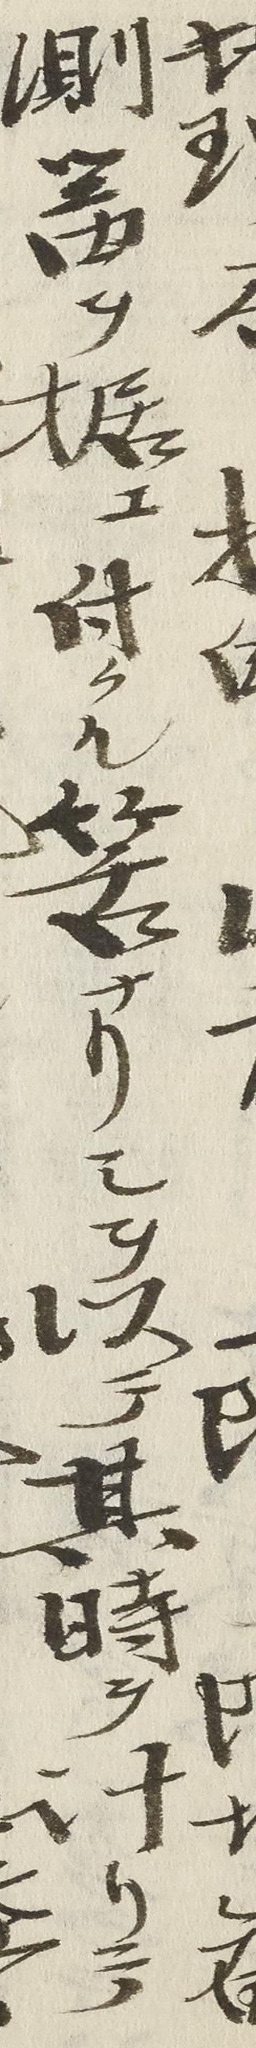測器ヲ据エ付タル筈ナリシヲ以テ其時ヲ計リテ
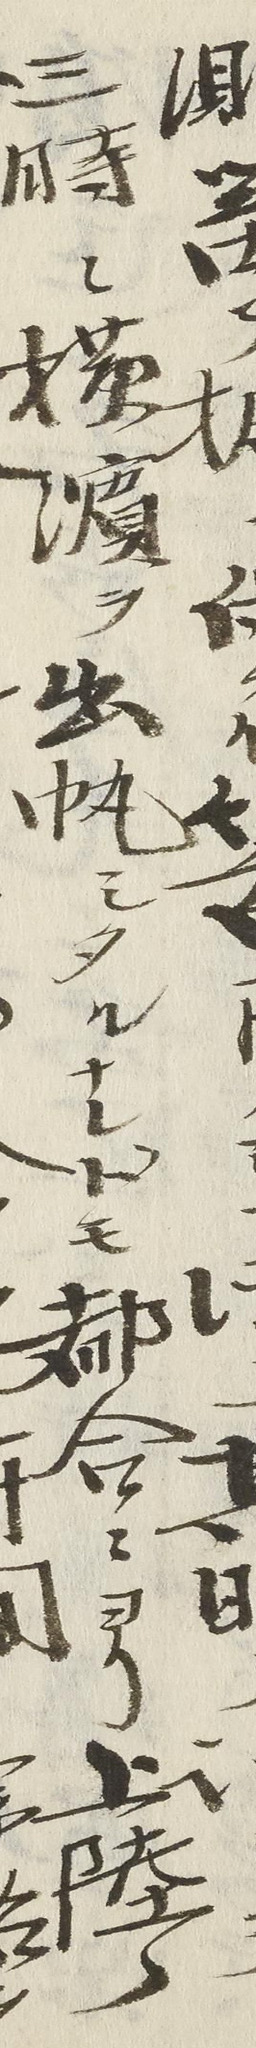三時二横浜ヲ出帆シタルナレドモ都合二ヨリ上陸ノ
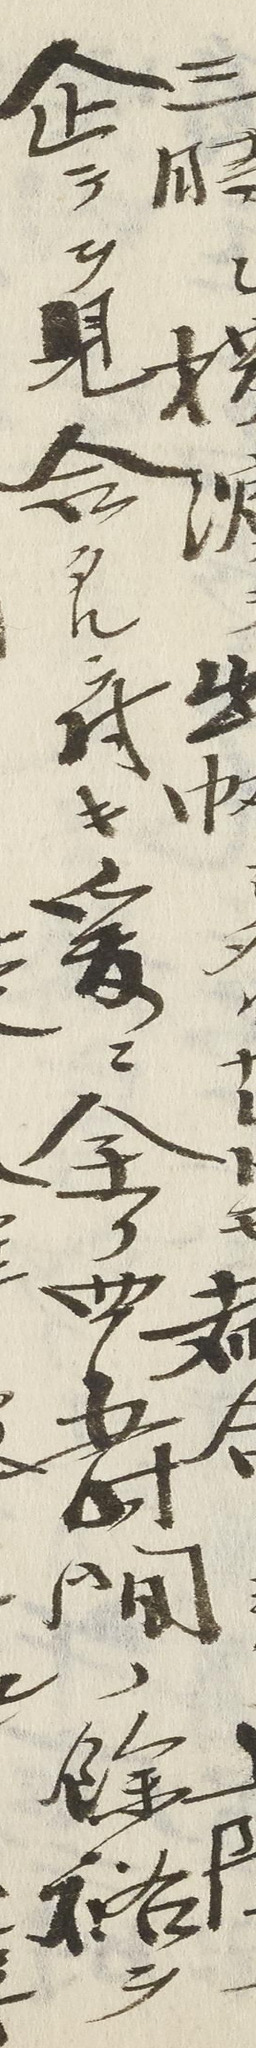企テヲ見合タル二付キ爰二全ク四五時間ノ餘裕ヲ
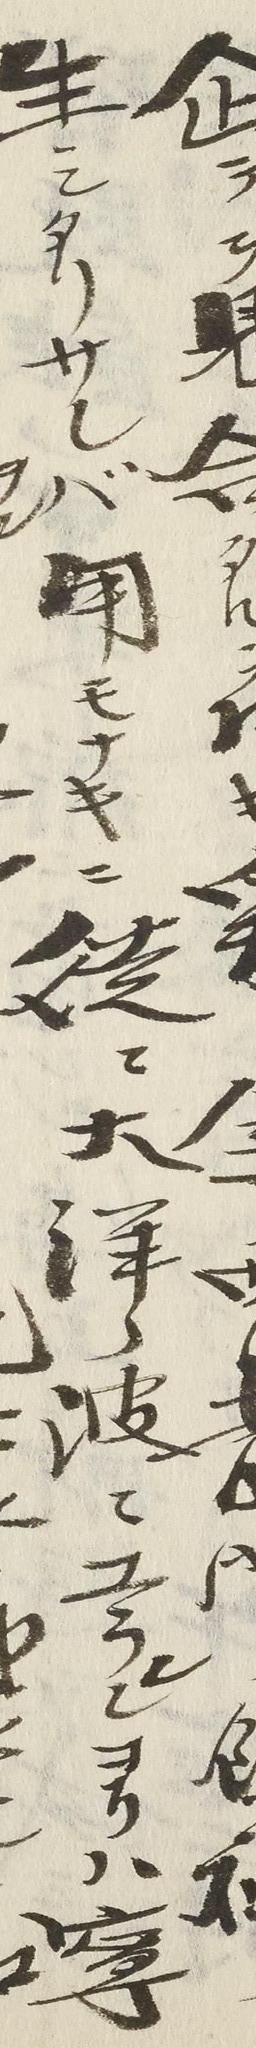生シタリサレバ用モナキニ徒二大洋ノ波二ユラレシヨリハ寧
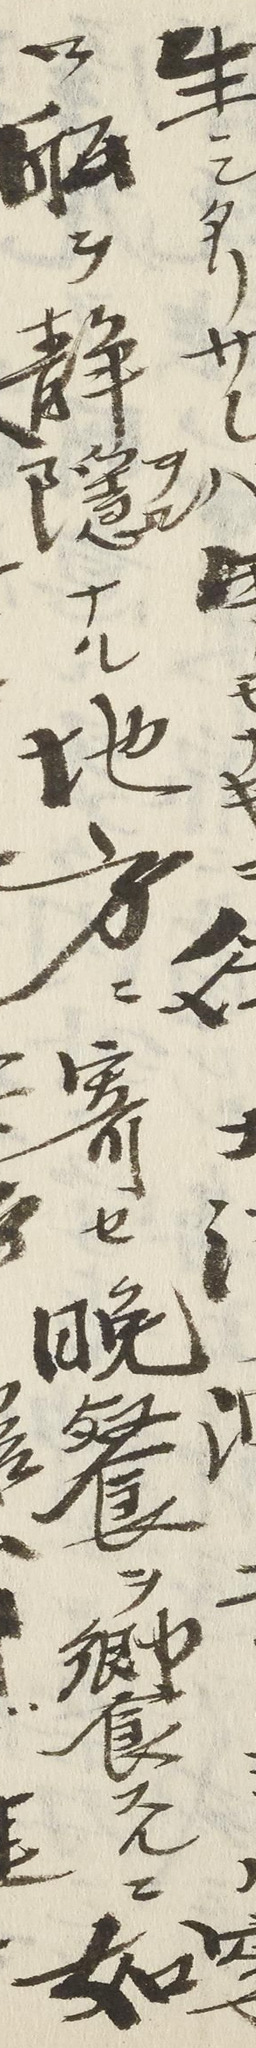ロ船ヲ静穏ナル地方二寄セ晩餐ヲ饗スル二如
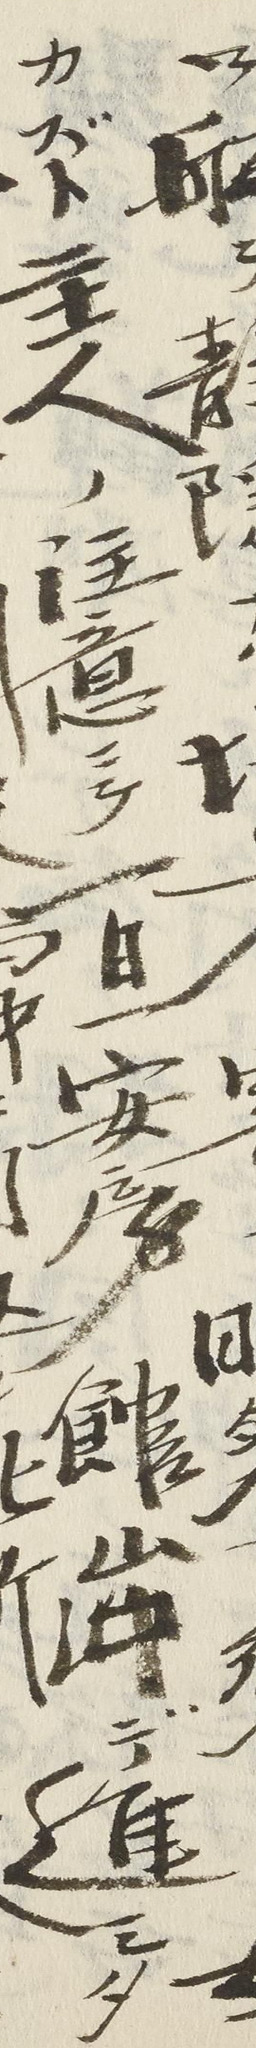カズㇳ主人ノ注意ニテ一旦安房館山沖デ進ミタ
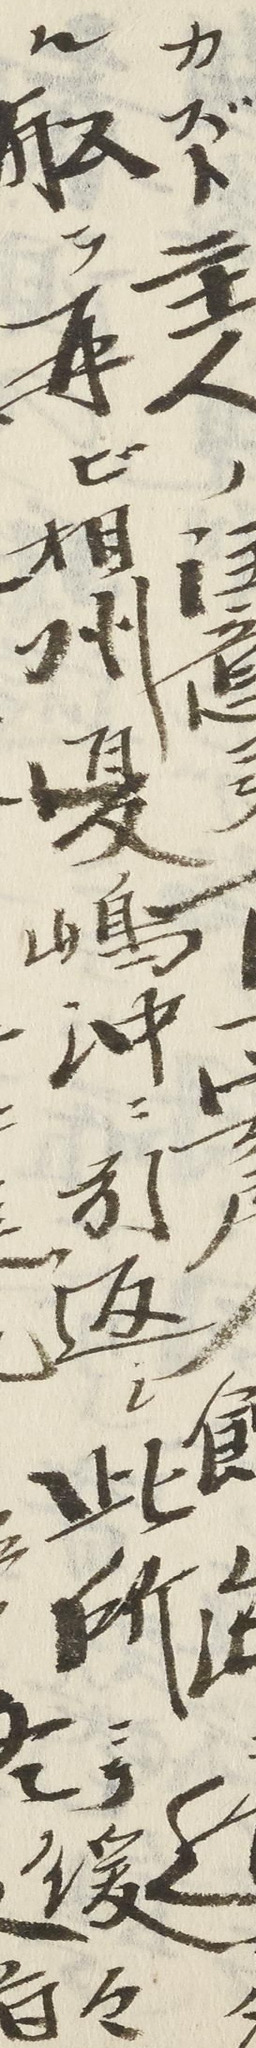ㇽ船ヲ再ビ相州榎嶋沖二引返し此所ニテ緩々
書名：日蝕録　全
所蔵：東京大学地震研究所図書室 Earthquake Research Institute Library, The University of Tokyo, JAPAN
